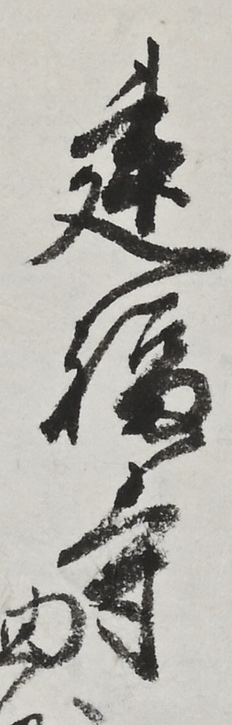建福寺

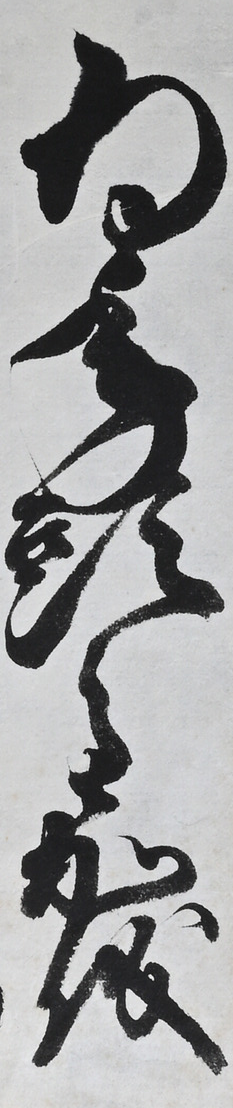為年頭之嘉儀
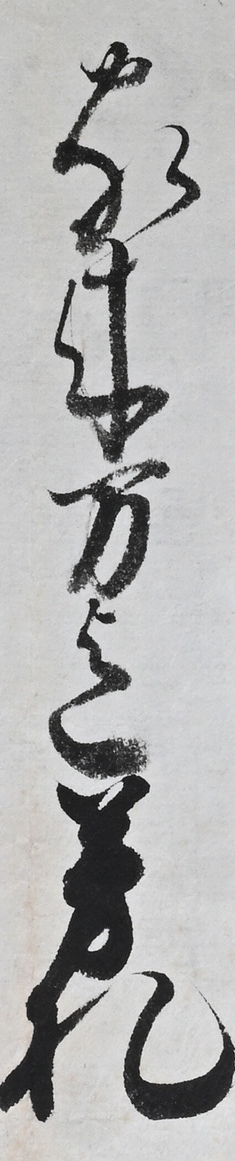家来方迄芳札
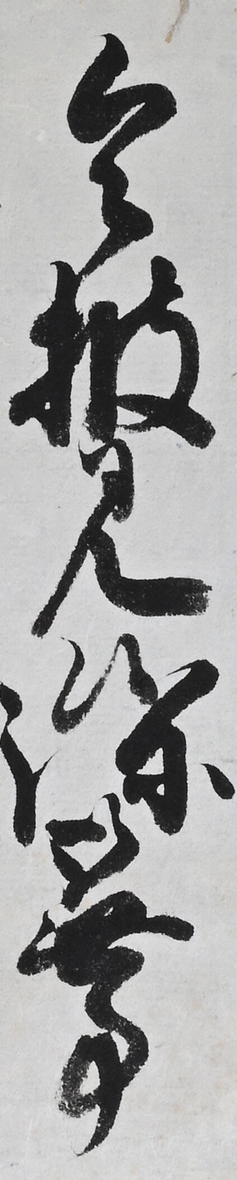令披見候弥御無事
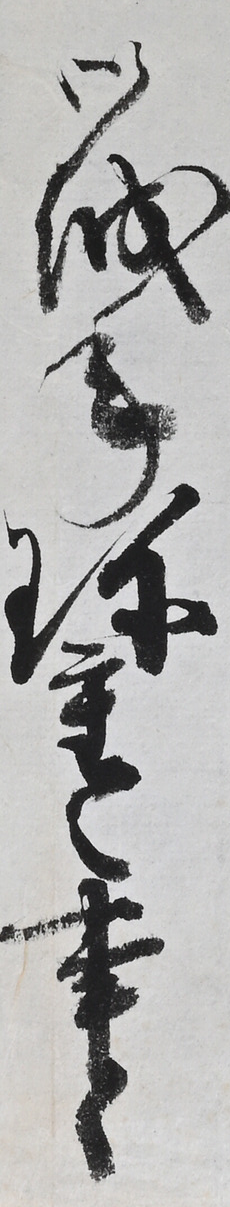御越年珍重之事ニ
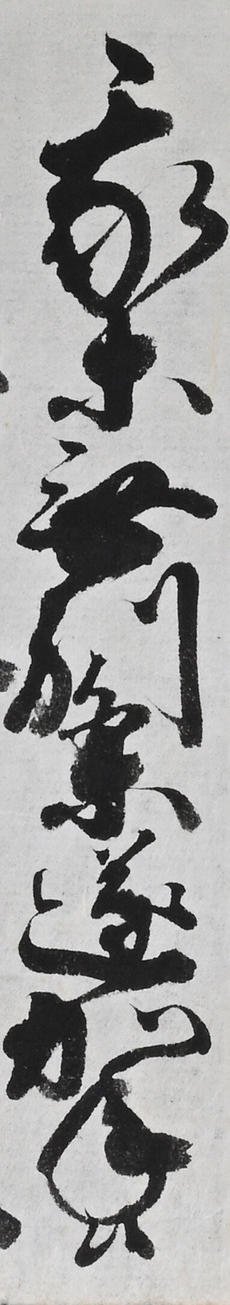我等無別条遂加年候
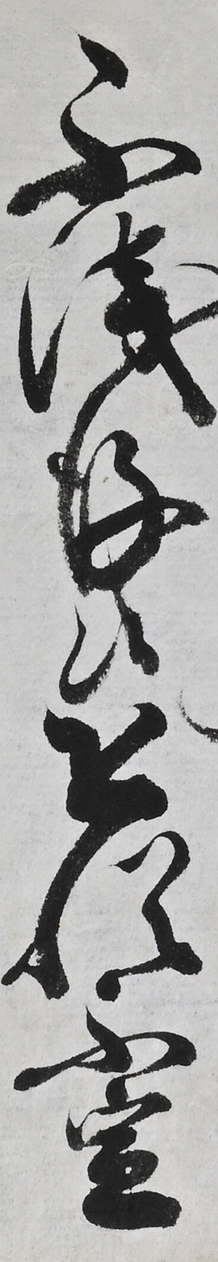不浅存候恐惶不宣
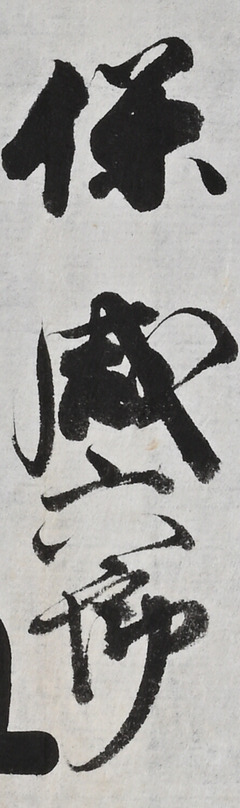保咸六郎
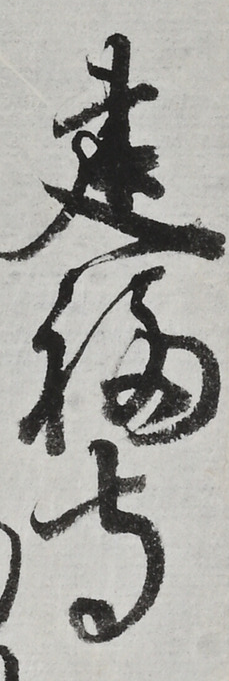建福寺
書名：書状
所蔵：伊那市立高遠町図書館・合同会社AMANE
